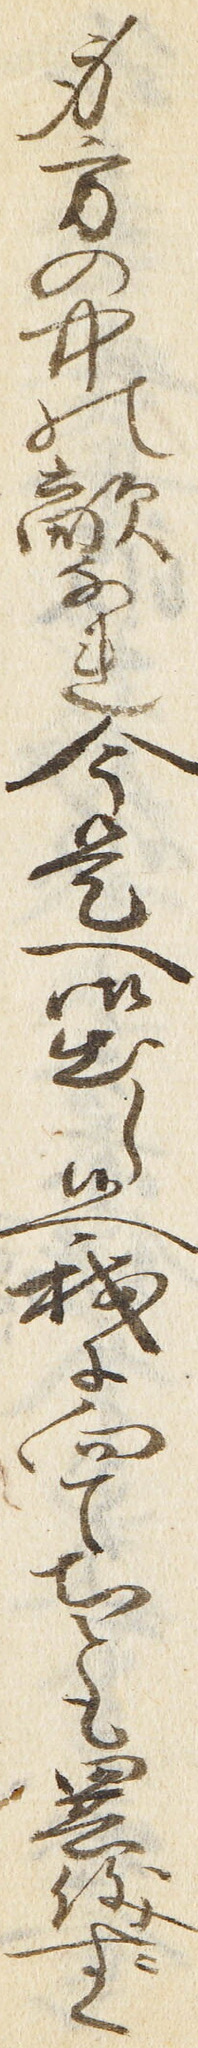身方の中の敵なれ今是へ御出し候へ我に向てちとも異儀ずく
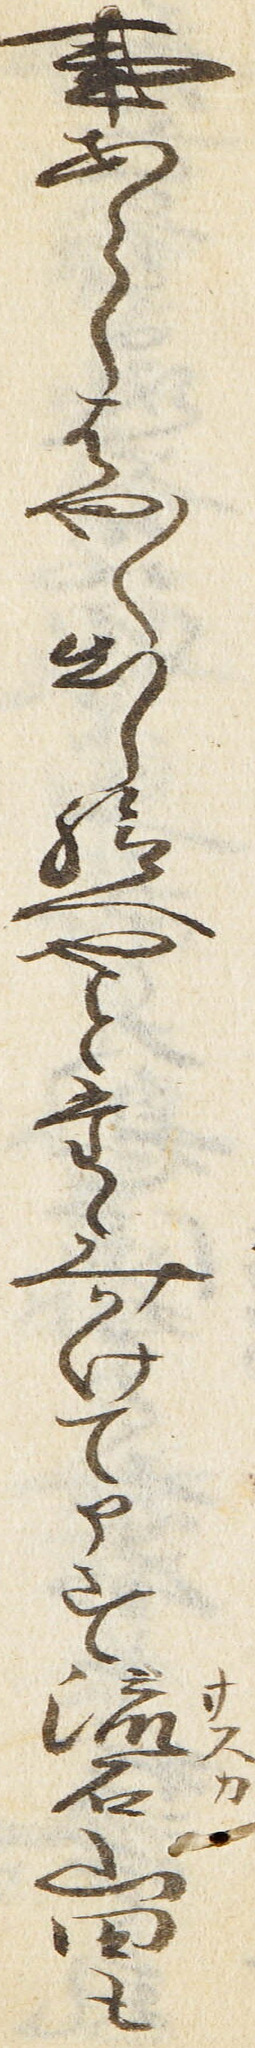事あらしはや〳〵出し給へやとたゝみかけて申す流石山田も
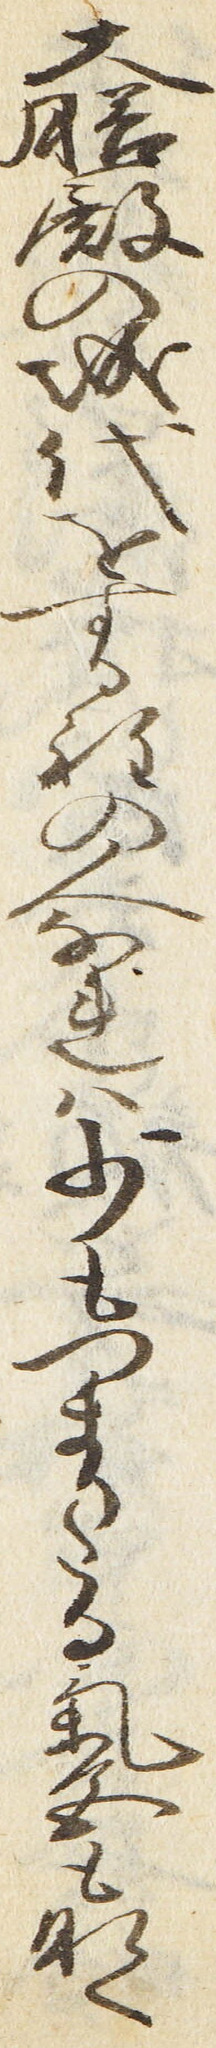大膳殿の城代をする程の人なれは少もつまりたる気色もなく
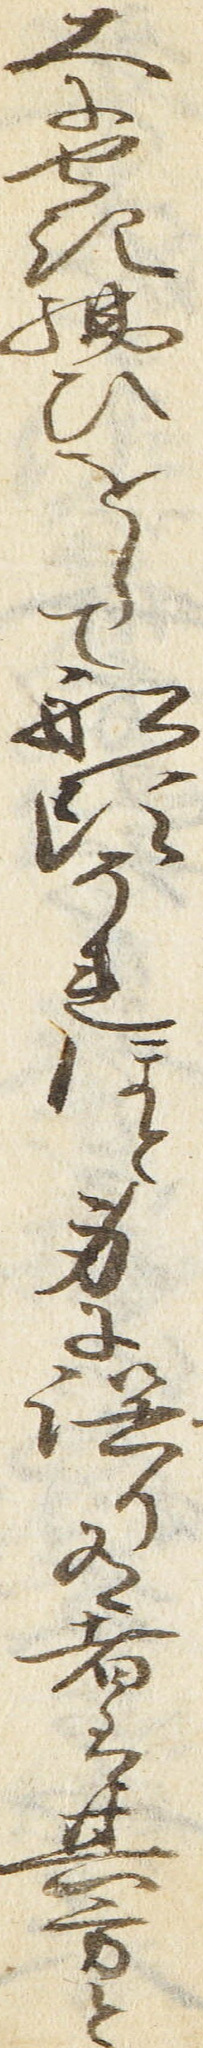大にせき払ひをして船頭それほと身に誤り有者は其方と
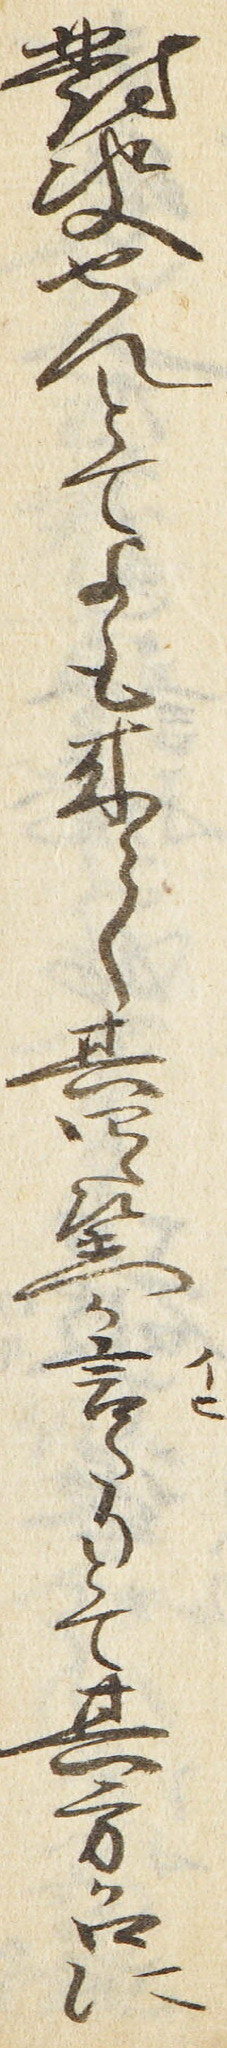対決せんとてよも来らし其四郎左衛門か言たりとて其方か口に

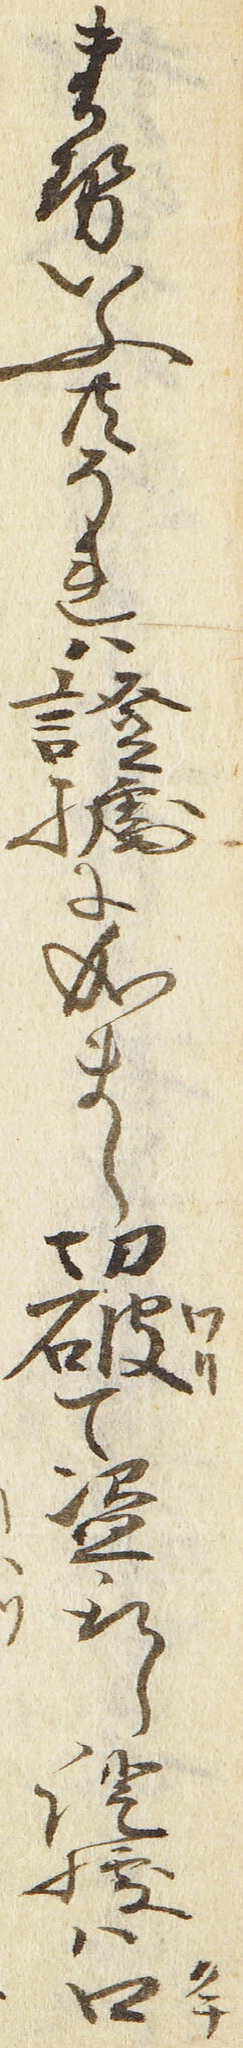まかせいふ共それは証拠に成まし切破て盗取し証拠は口
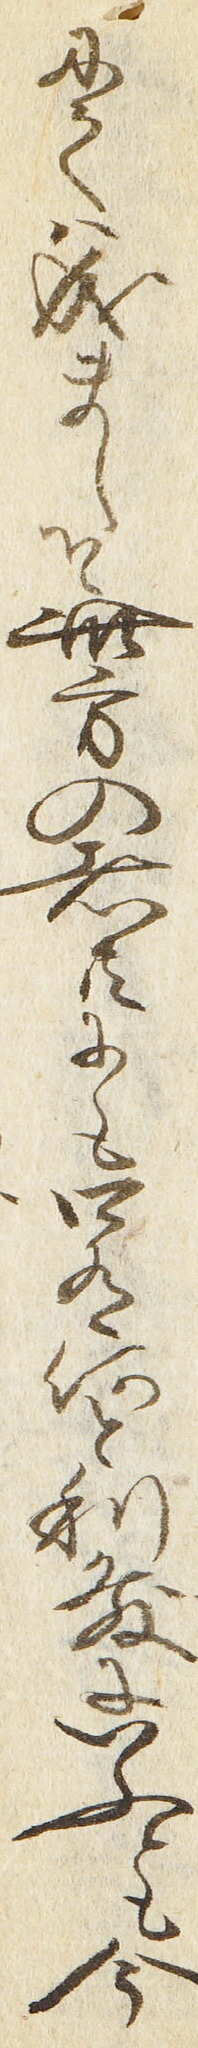にては成ましそ此方の者共にも口有何と利発にいふとも今
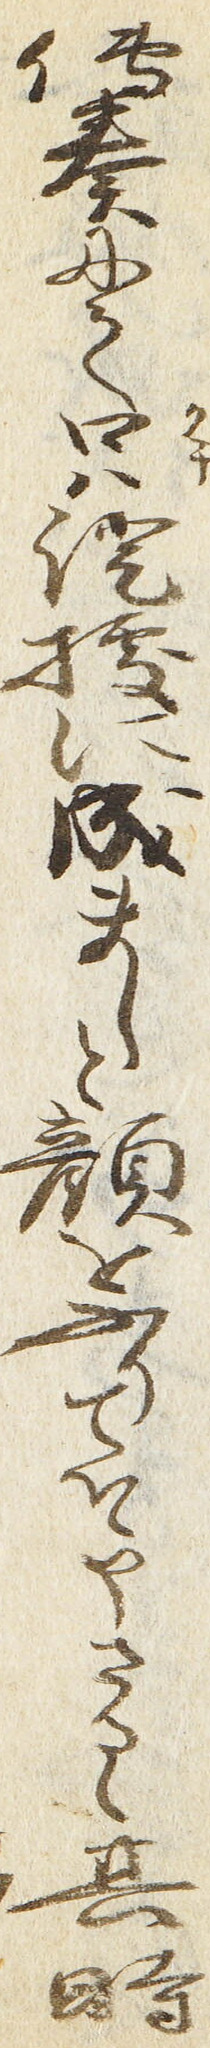伝奏にて口は証拠に成ましと顔をふりてそ申さるゝ其時
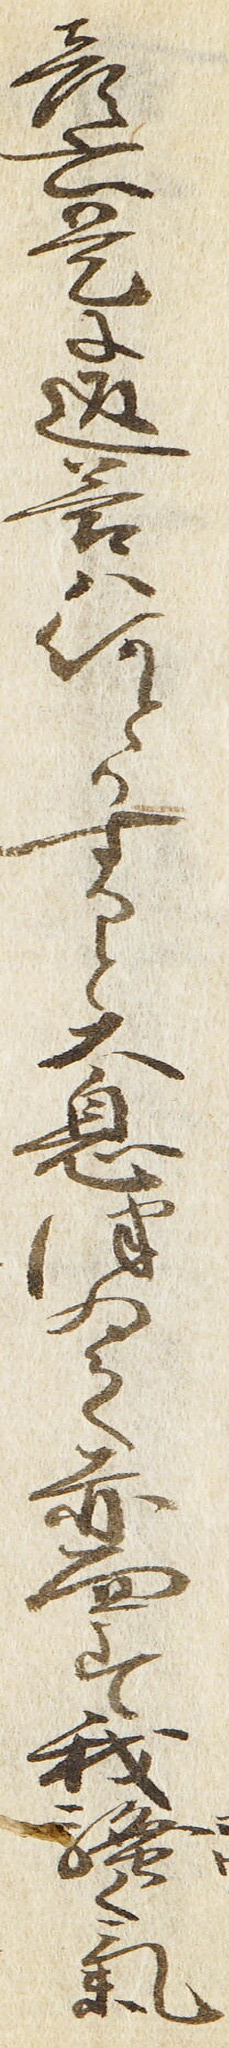彦六是に返答は何とかすると大息つゐて赤面す我騒く気
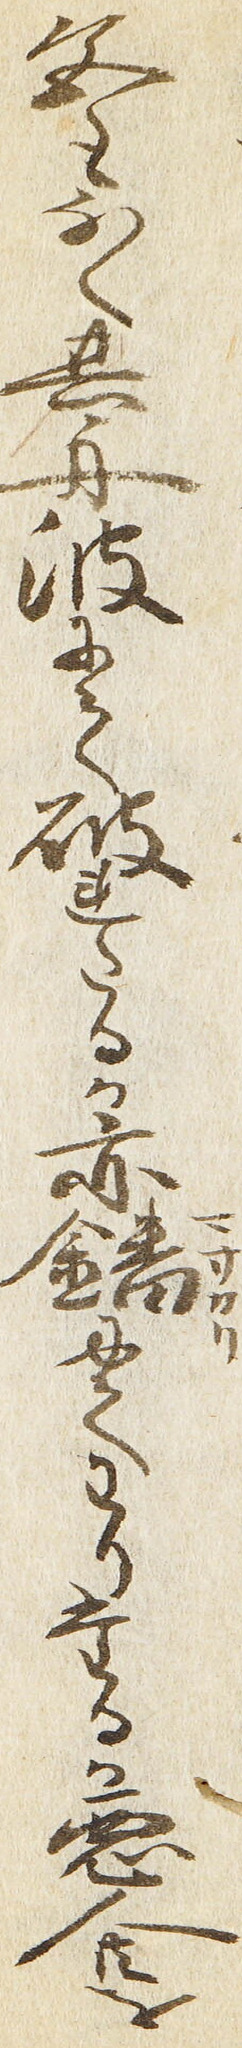色もなく其舟波にて破れたるか亦鐇にてわりたるか悪人共を
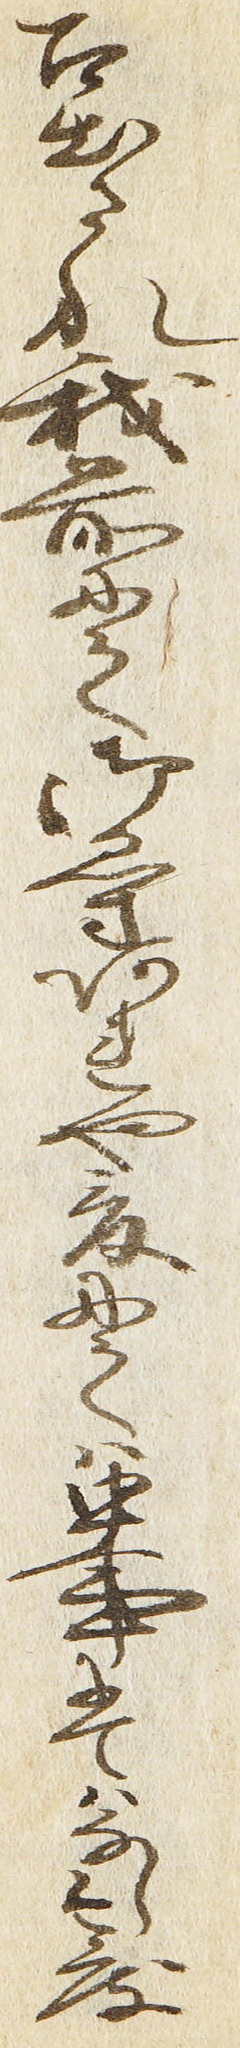召出され我前にて御尋あれや爰にては申事にてはなし今度
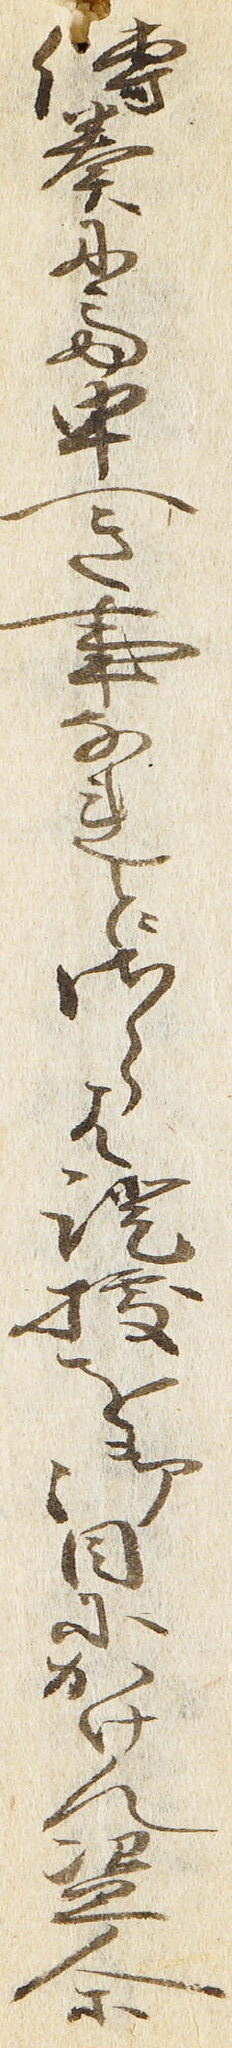伝奏にて申へき事なれどさらは証拠を御目にかけん盗人等
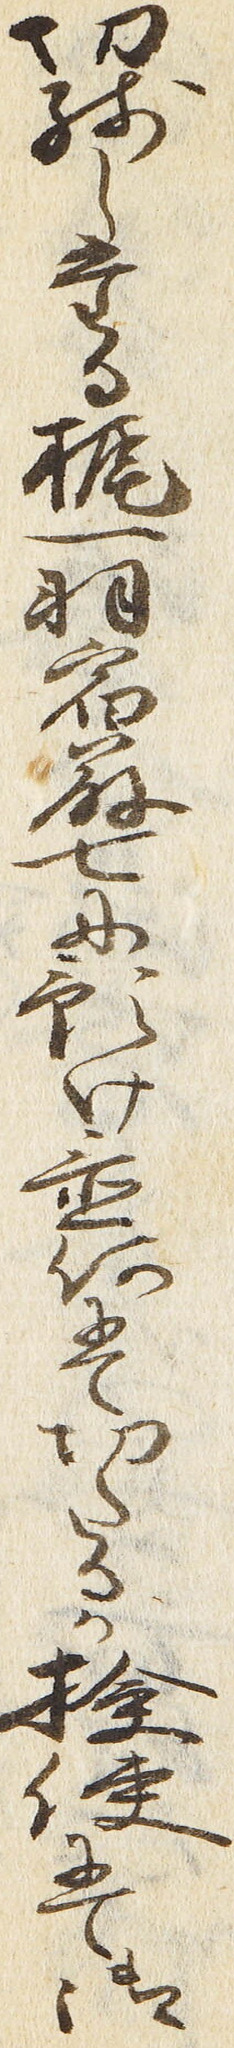切残したる梶一羽宿藤七に預け置何にて切たるか検使にて御
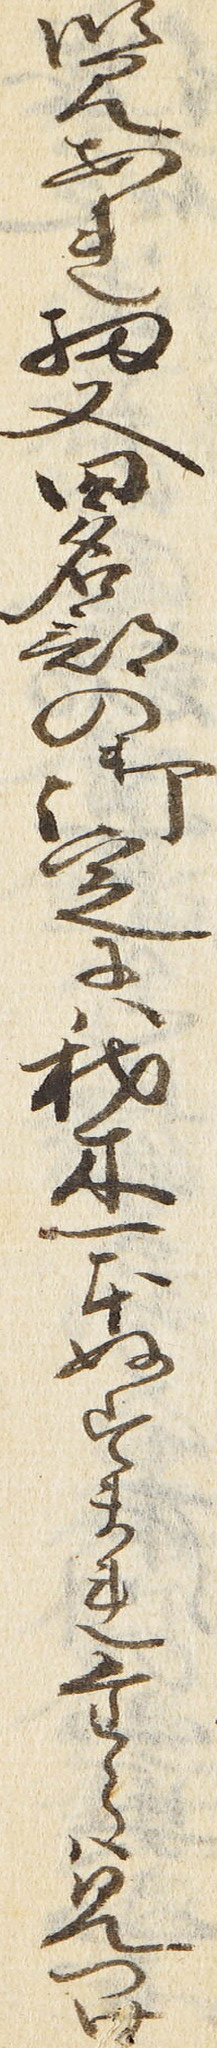覧あれ扨又田名部の御定には材木一本ぬすまれたらは見つけ
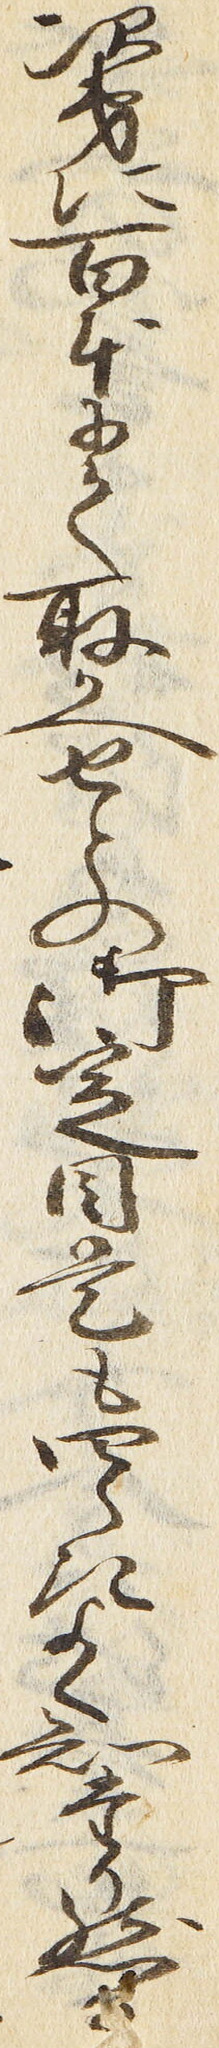次第に百本にて取かへせとの御定目是も四郎左よく知たり然
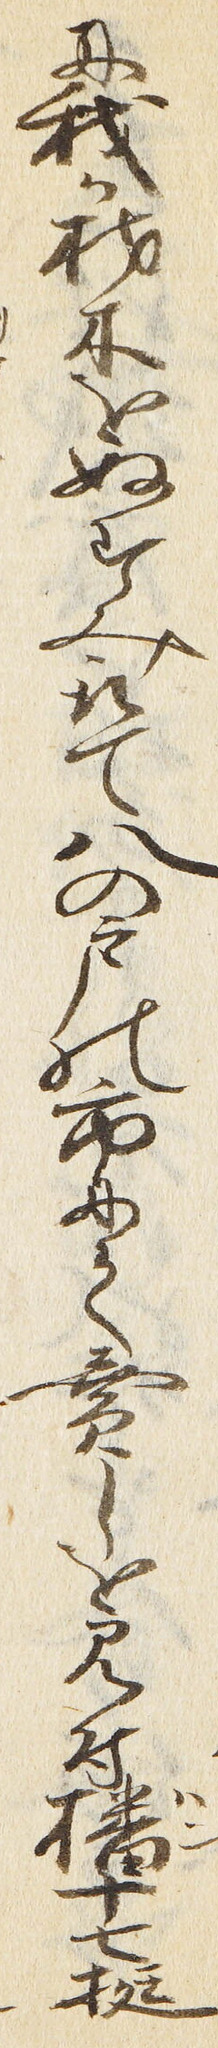に我か材木をぬすみ取て八の戸の市にて売しを見付㠶橎十七挺
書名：海陸世話日記
